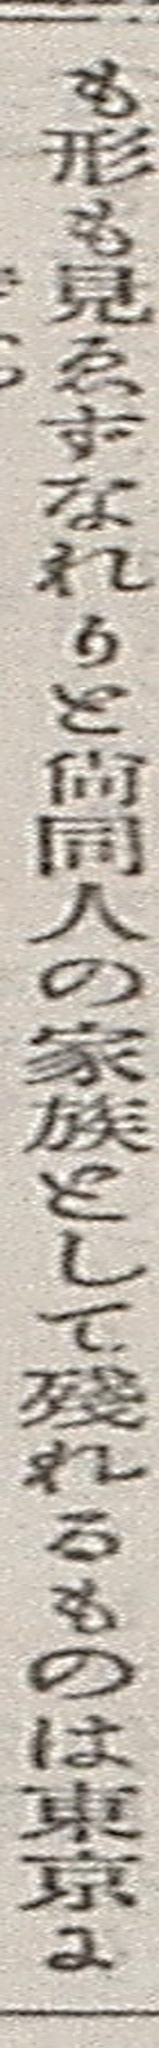も形も見ゑずなれりと尚同人の家族として残れるものは東京に
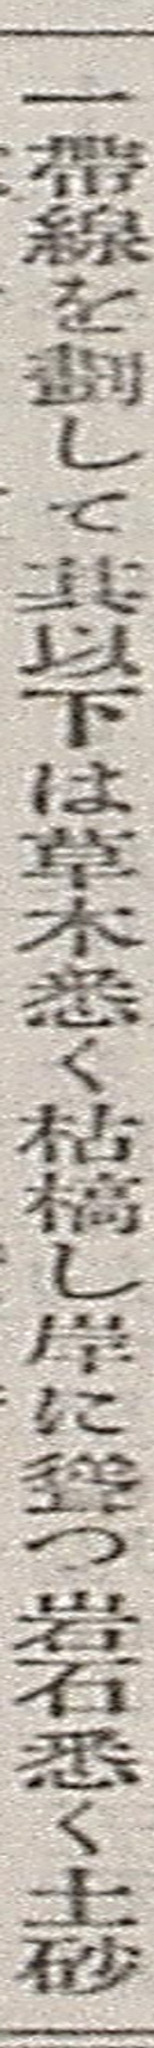一帯線を画して其以下は草木悉く枯槁し岸に聳つ岩石悉く土砂
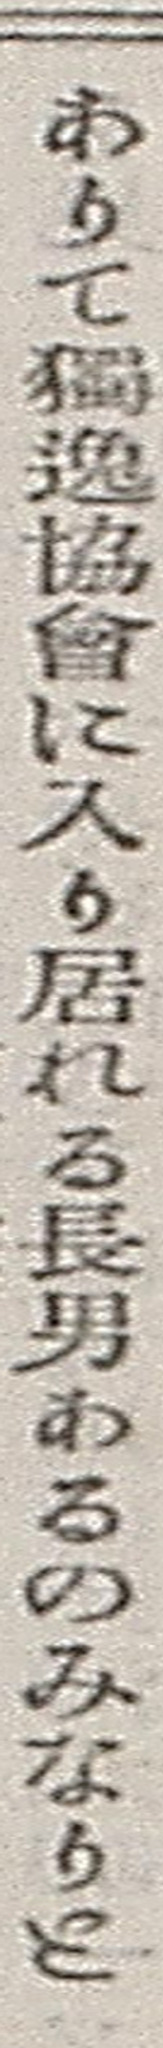ありて独逸協会に入り居れる長男あるのみなりと
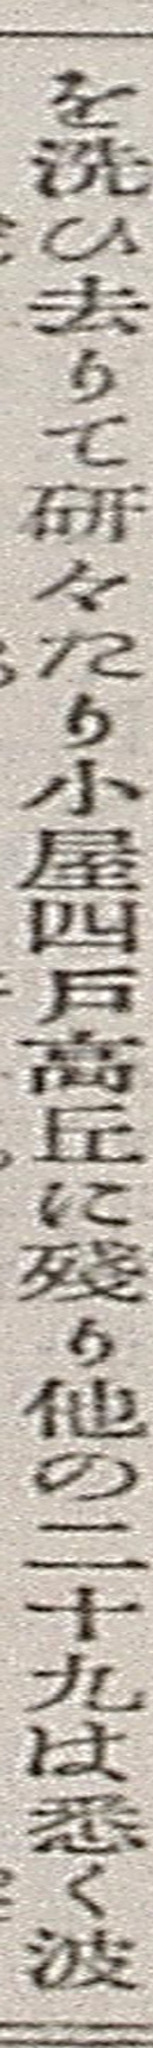を洗ひ去りて研々たり小屋四戸高丘に残り他の二十九は悉く波
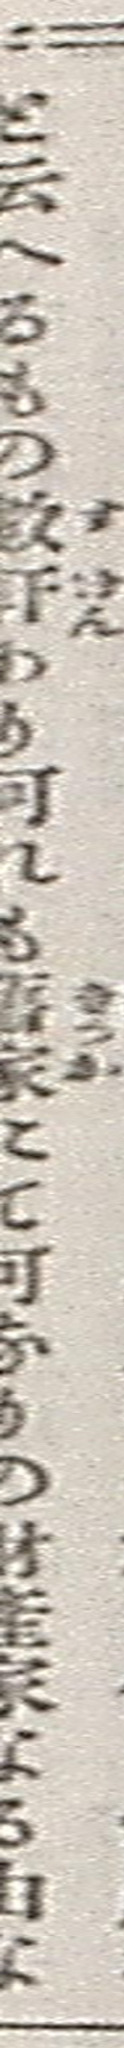と云へるもの数軒あり何れも旧家にて可なりの財産家なる由な
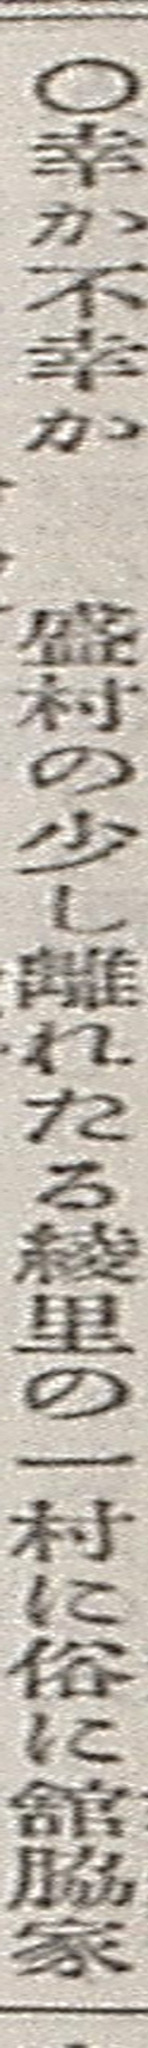○幸か不幸か盛村の少し離れたる綾里の一村に俗に舘脇家
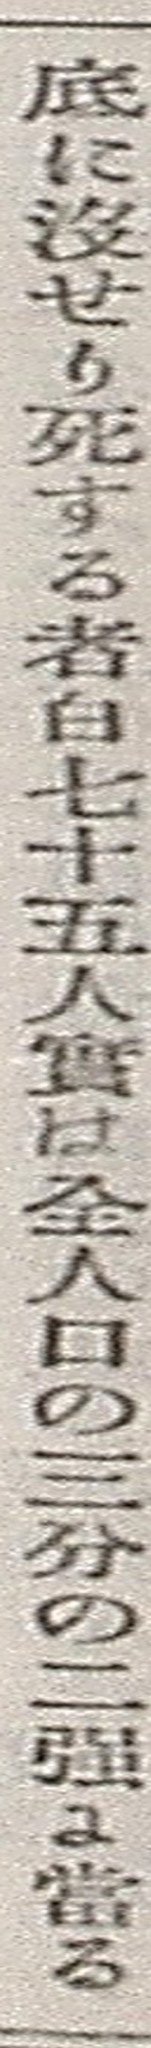底に没せり死する者百七十五人実は全人口の三分の二強に当る
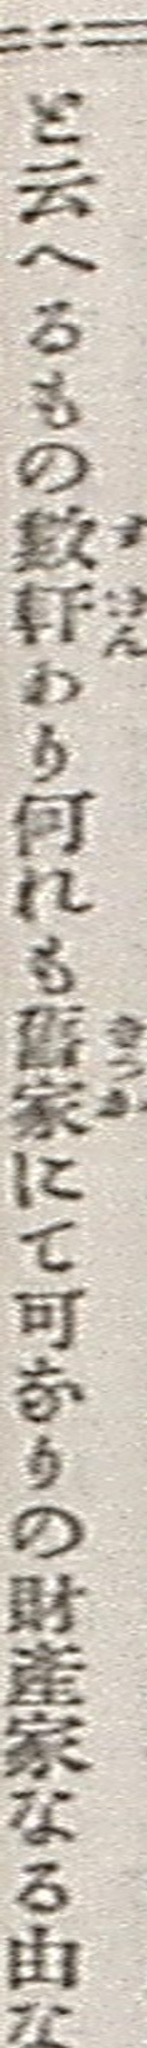と云へるもの数軒あり何れも旧家にて可なりの財産家なる由な
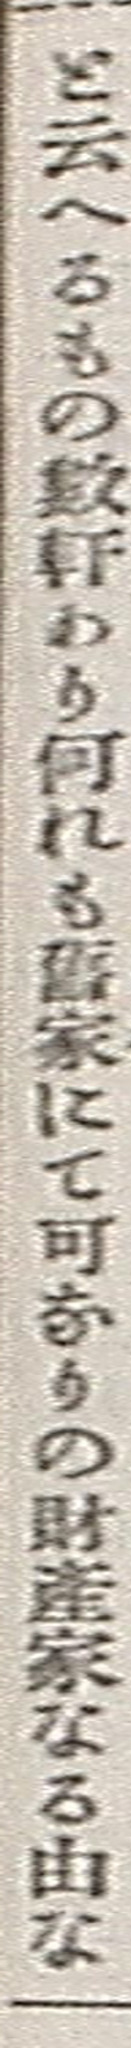と云へるもの数軒あり何れも旧家にて可なりの財産家なる由な

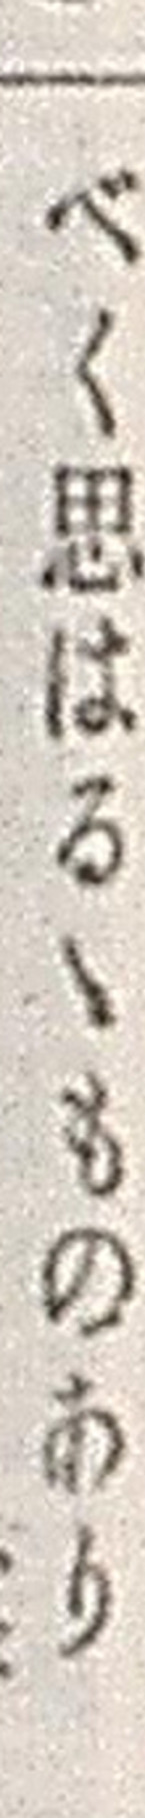べく思はるゝものあり
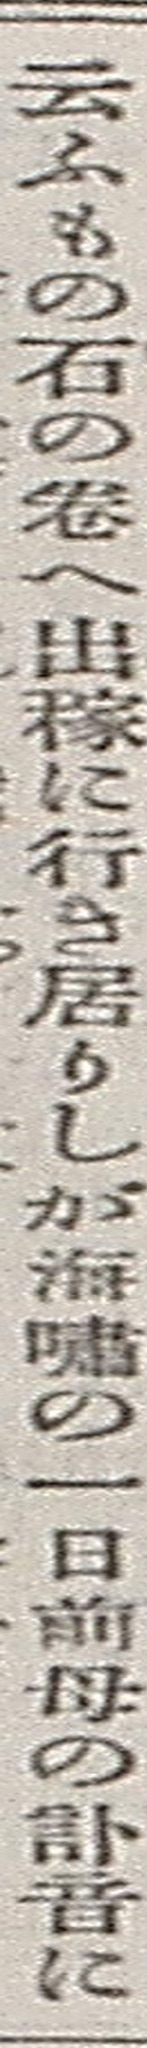云ふもの石の巻へ出稼に行き居りしが海嘯の一日前母の訃音に
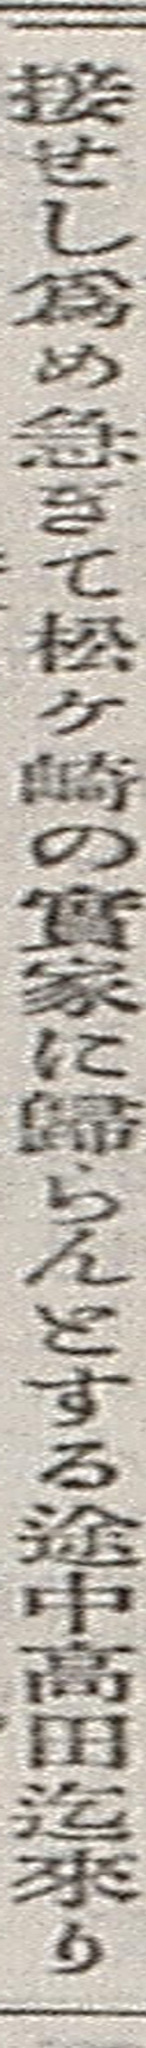接せし為め急ぎて松ヶ崎の実家に帰らんとする途中高田迄来り
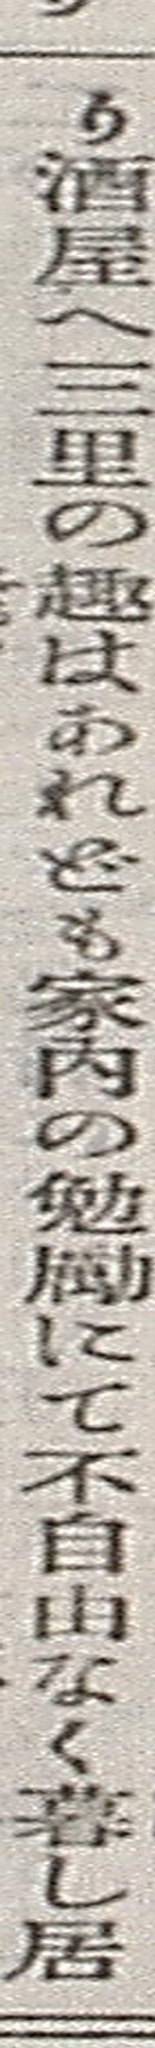り酒屋へ三里の趣はあれども家内の勉励にて不自由なく暮し居
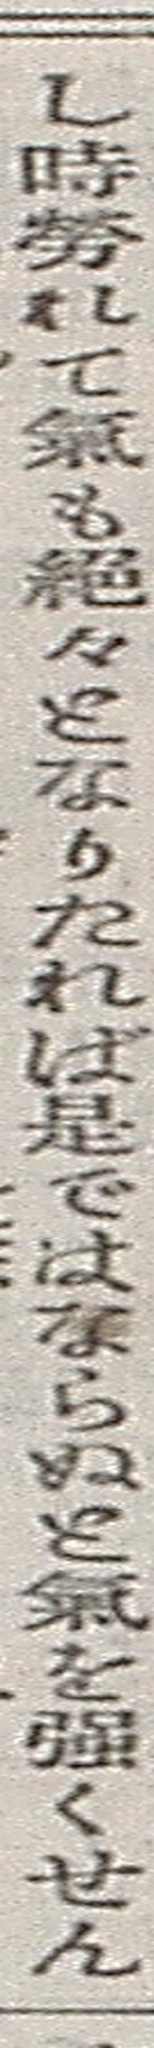し時労れて気も絶々となりたれば是ではならぬと気を強くせん
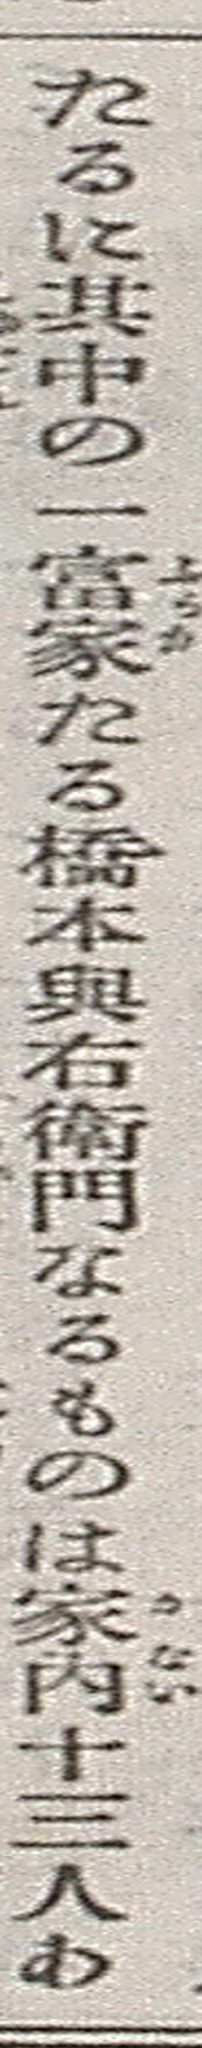たるに其中の一富家たる橋本與右衛門なるものは家内十三人あ
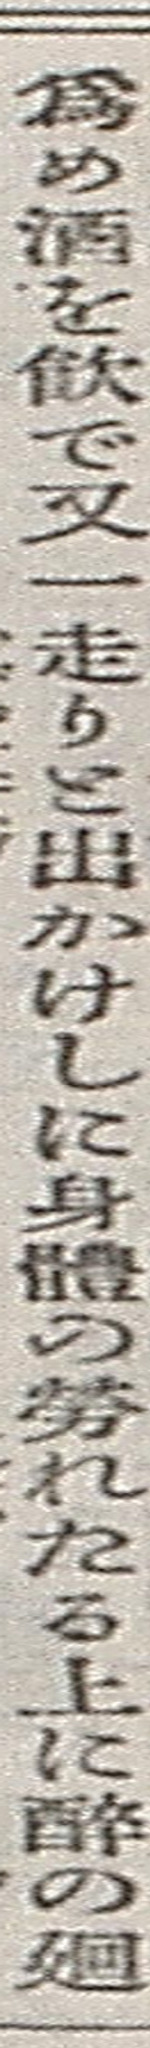為め酒を飲で又一走りと出かけしに身体の労れたる上に酔の廻
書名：風俗畫報臨時増刊第百二十號　大海嘯被害録（下）
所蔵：東京大学地震研究所図書室 Earthquake Research Institute Library, The University of Tokyo, JAPAN
